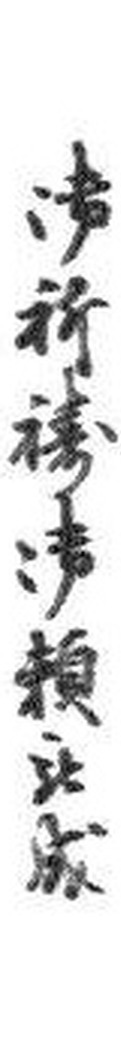御祈禱御頼被成
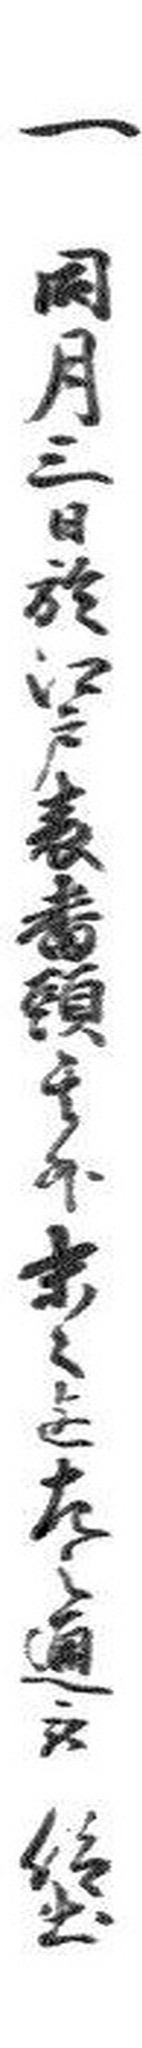一同月三日於江戸表番頭其外末々迄左之通被仰出
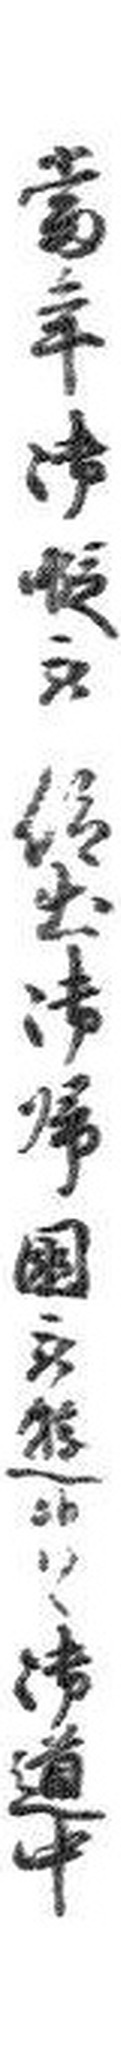当年御暇被仰出御帰国被遊候ハヽ御道中
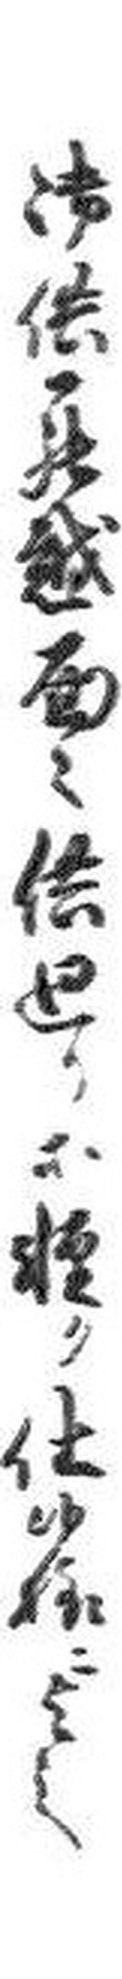御供罷越面々供廻り等軽ク仕候様ニ与之

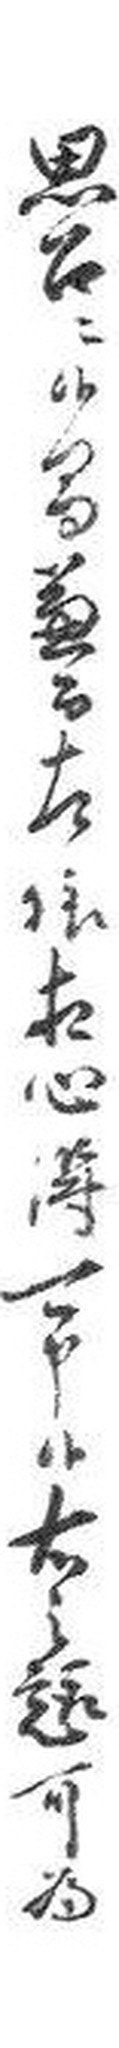思召候間兼而左様相心得可申候右之趣可為
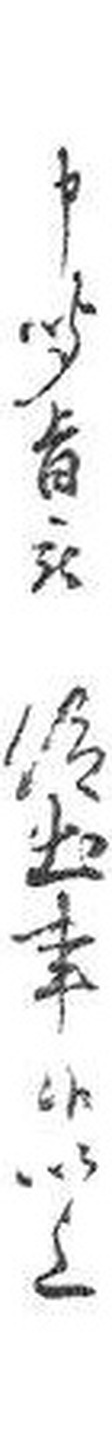申聞旨被仰出事候以上
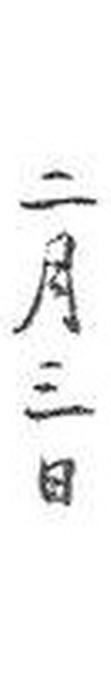二月三日
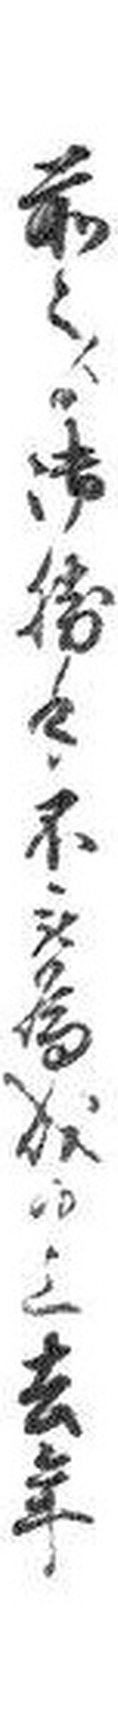前々ゟ御勝手不被為成候上去年
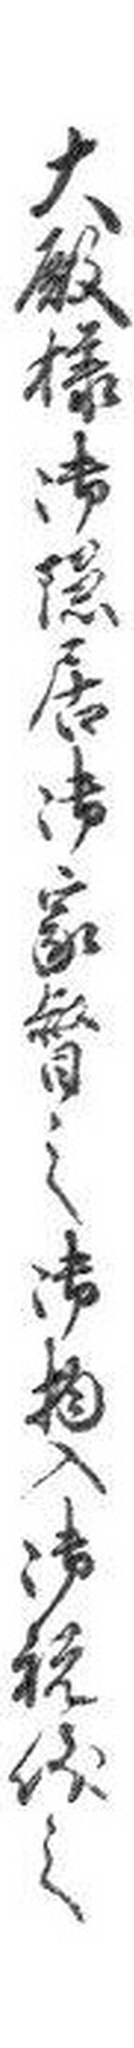大殿様御隠居御家督之御物入御祝儀之
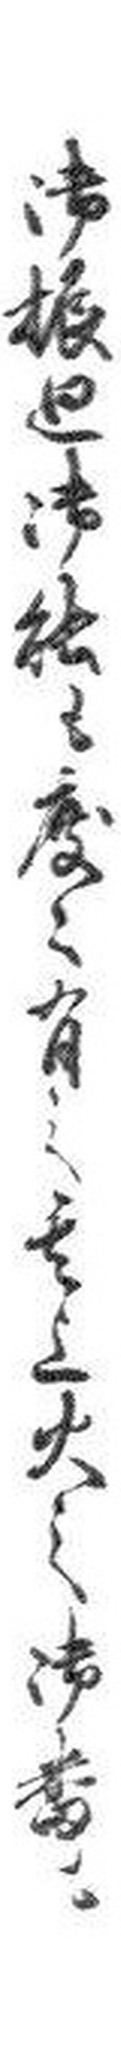御振廻御能も度々有之其上火之御番も
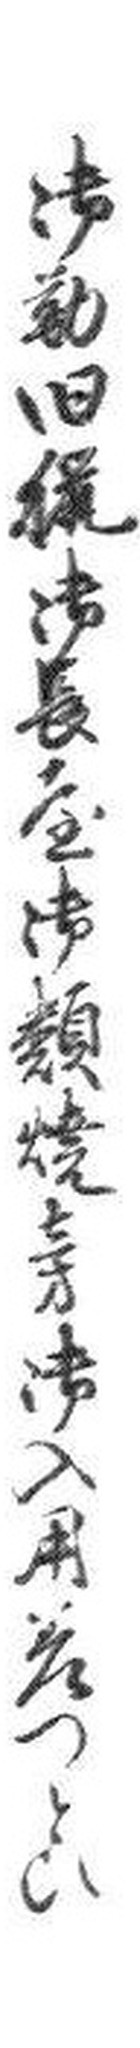御勤旧臘御長屋御類焼旁御入用差つとひ
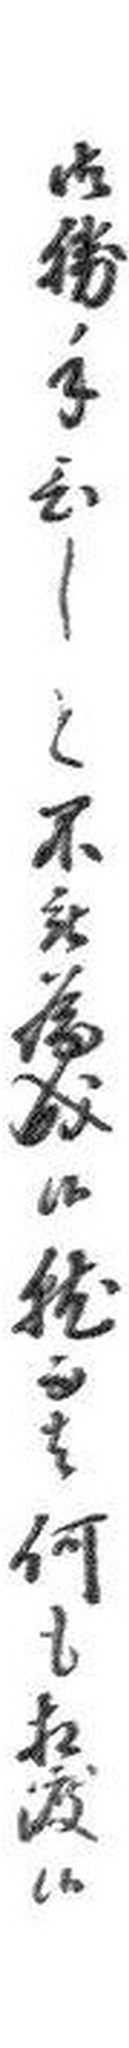御勝手ひしと不被為成候就而者何も相渡候
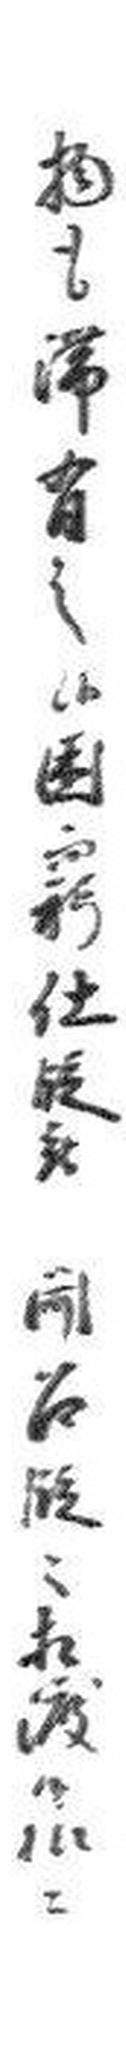物も滞有之候困窮仕段被聞召段々相渡候様ニ
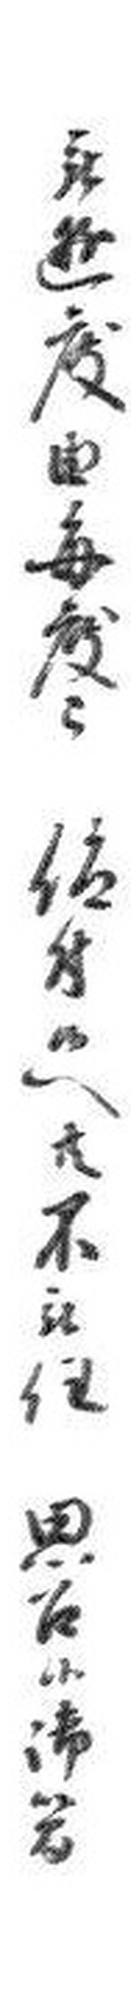被遊度由毎度被仰付候へ共不被任思召候御簡
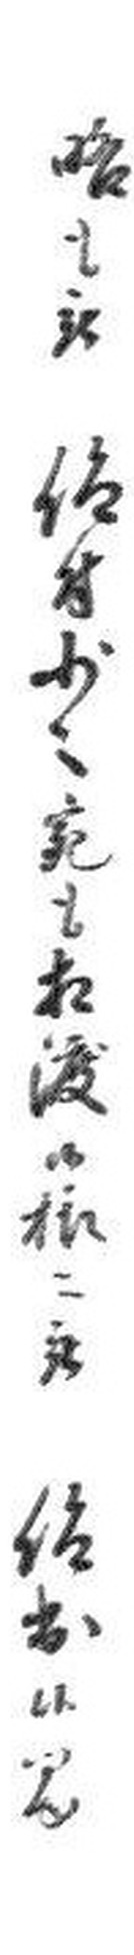略も被仰付少々宛も相渡候様ニ被仰出候間
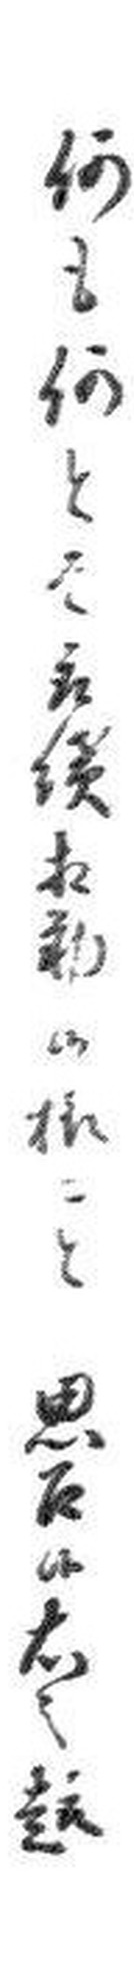何も何とそ取続相勤候様ニと思召候右之趣
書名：家譜 二十八 吉邦公 従宝永七年七月五日到正徳元年十二月
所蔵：福井県文書館 Fukui Prefectural Archives
